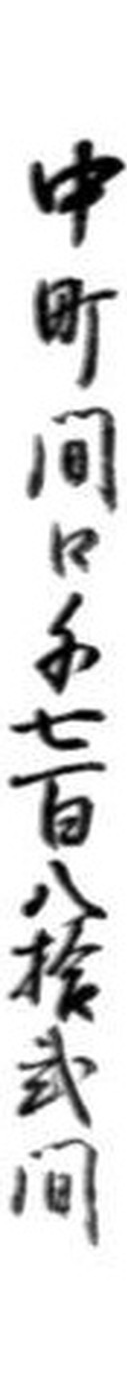中町間口千七百八拾弐間
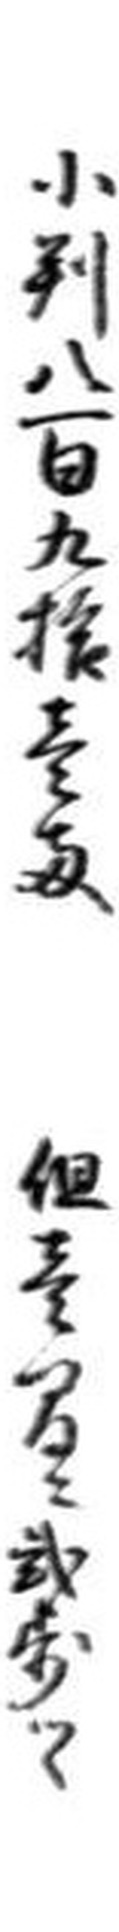小判八百九拾壱両但壱間ニ弐歩ツヽ
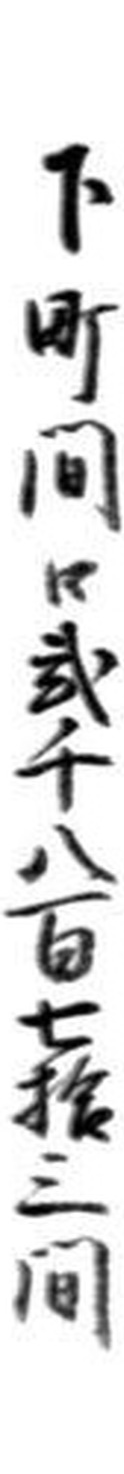下町間口弐千八百七拾三間
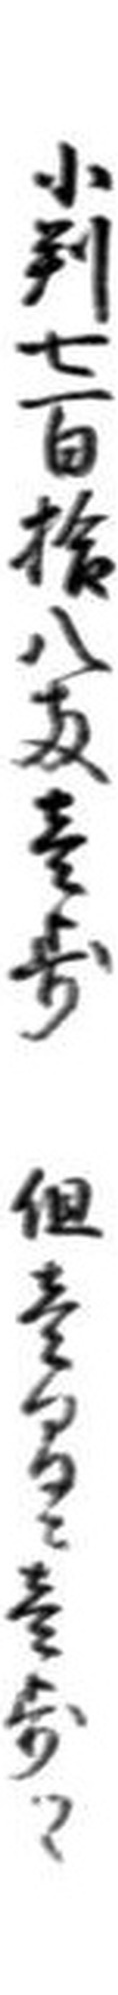小判七百拾八両壱歩但壱間ニ壱歩ツヽ
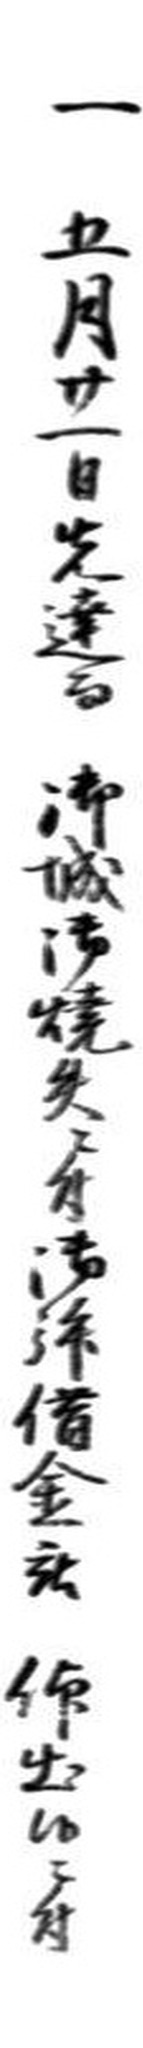一五月廿一日先達而御城御焼失ニ付御拝借金被仰出候ニ付
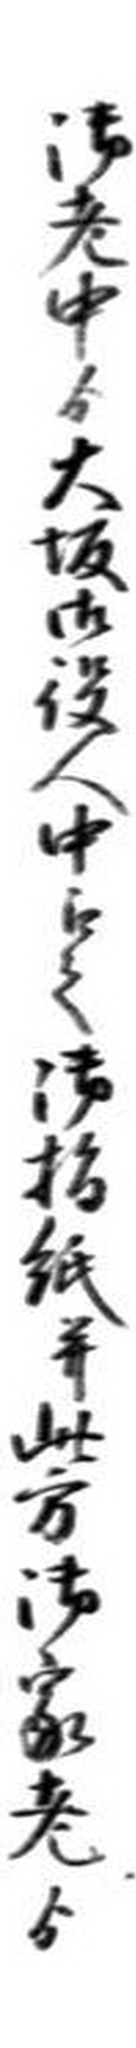御老中ゟ大坂御役人江之御指紙并此方御家老ゟ
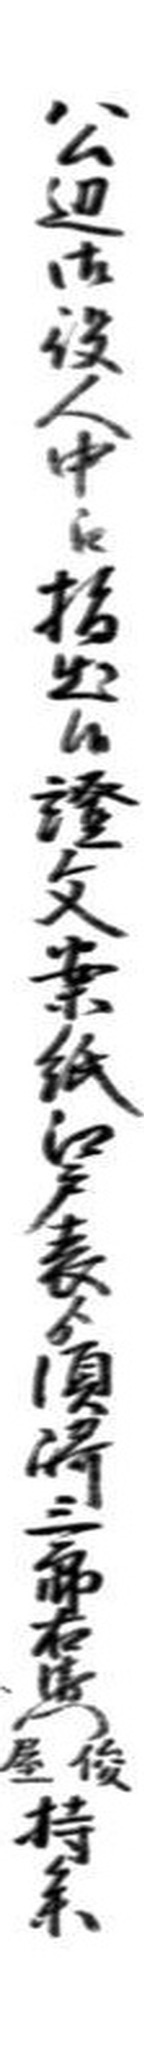公辺御役人江指出候証文案紙江戸表ゟ須崎三郎右衛門俊屋持参
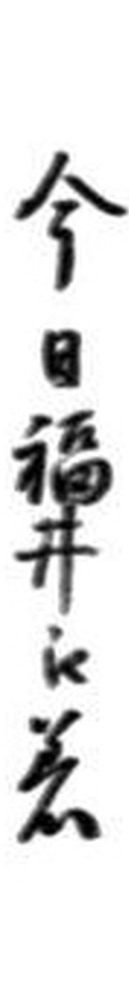今日福井江着

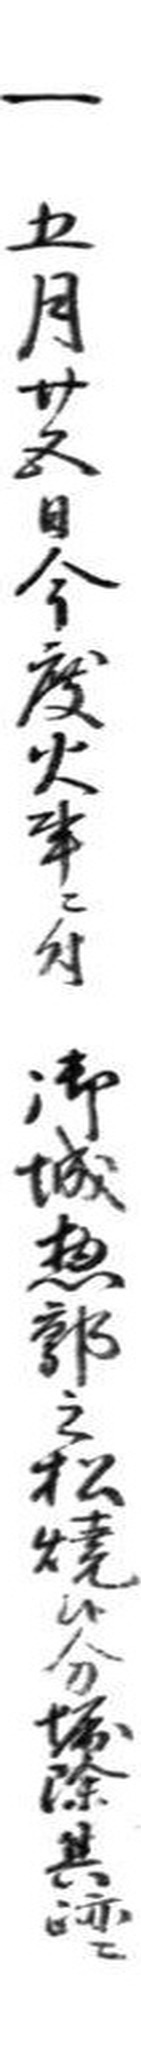一五月廿五日今度火事ニ付御城惣郭之松焼候分堀除其跡ニ
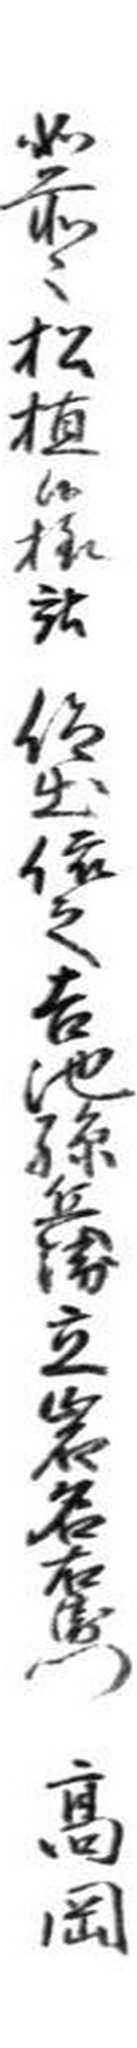如前々松植候様被仰出依之吉池孫兵衛立岩名右衛門高岡
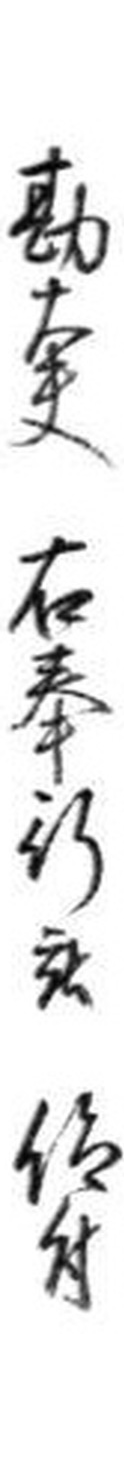勘太夫右奉行被仰付
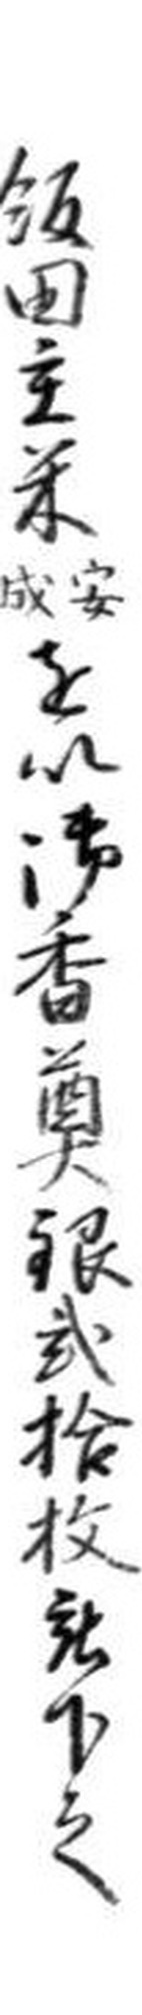飯田主米安成を以御香奠銀弐拾枚被下之
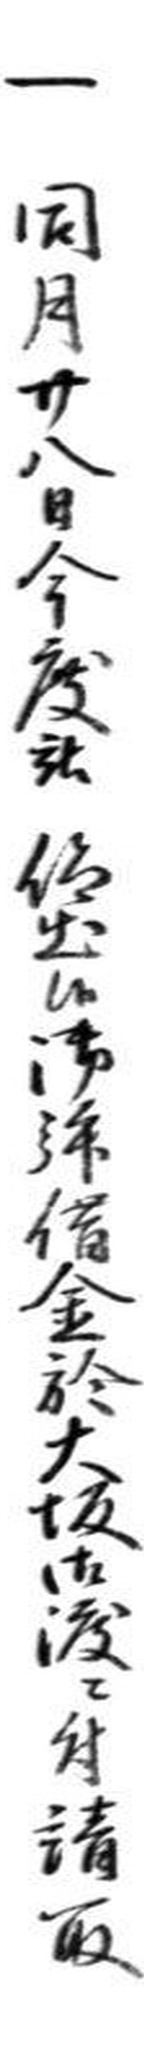一同月廿八日今度被仰出候御拝借金於大坂御渡ニ付請取
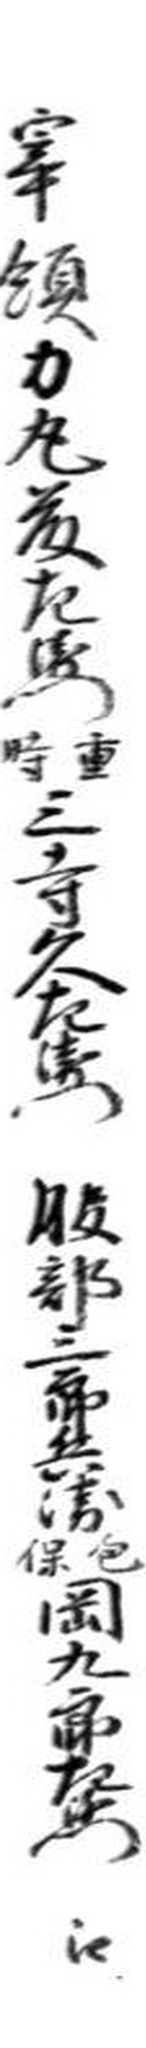宰領力丸藤左衛門重時三寺久左衛門服部三郎兵衛包保岡九郎左衛門江
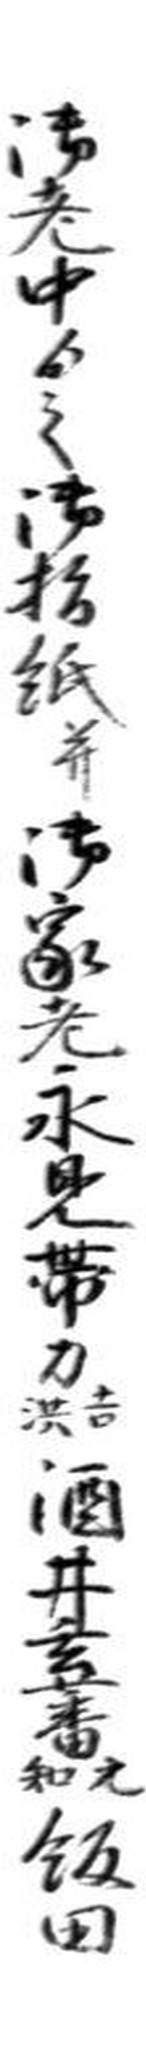御老中ゟ之御指紙并御家老永見帯刀吉洪酒井玄蕃元知飯田
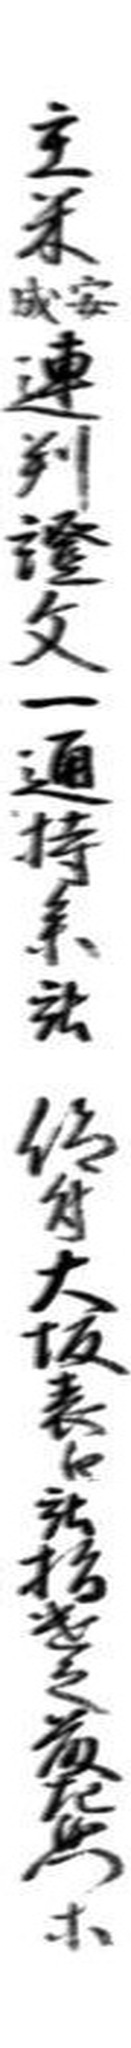主米安成連判証文一通持参被仰付大坂表江被指遣之藤左衛門等
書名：家譜 七 光通公 従寛文四年到同九年
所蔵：福井県文書館 Fukui Prefectural Archives
